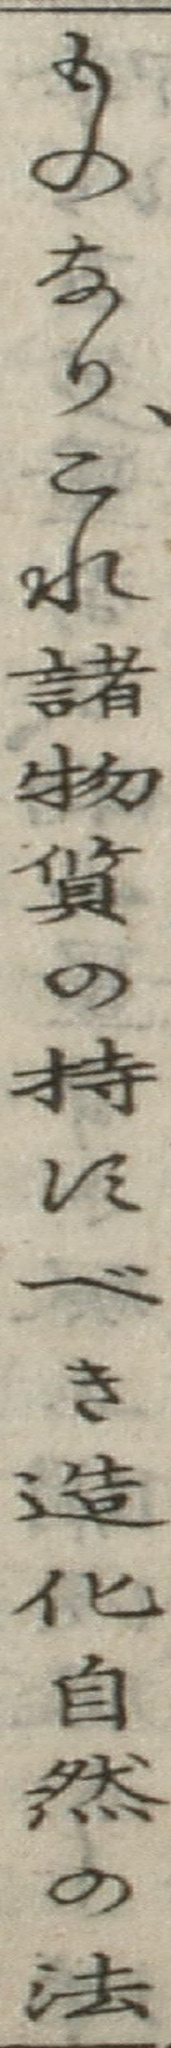ものなり、これ諸物質の持すべき造化自然の法
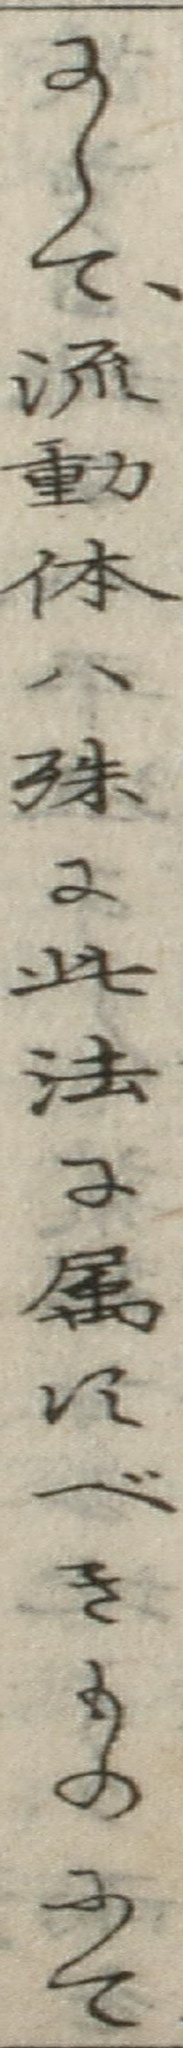にして、流動体は殊に此法に属すべきものにて、
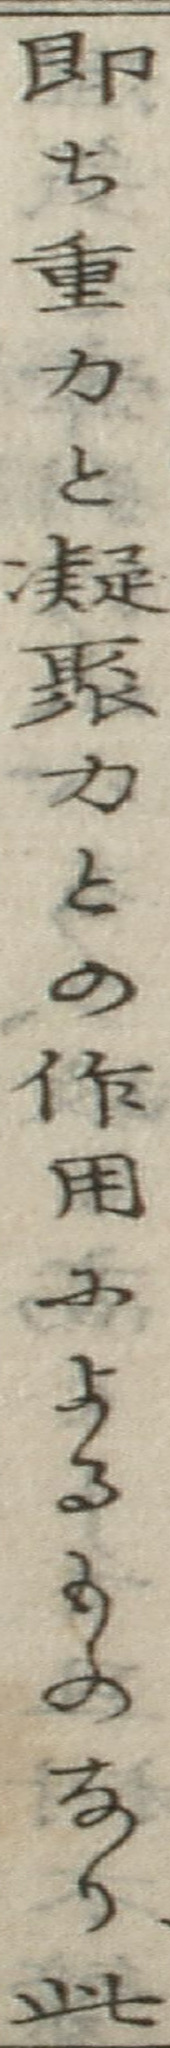即ち重力と凝聚力との作用によるものなり、此
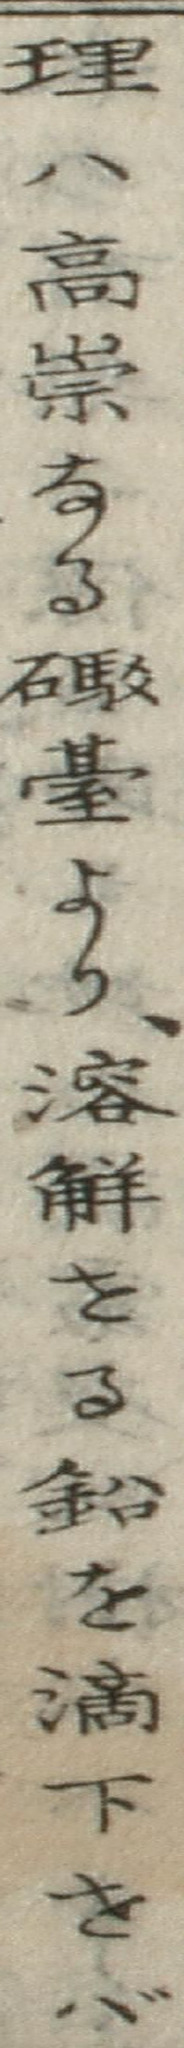理は高崇なる礟台より、溶解せる鉛を滴下せば
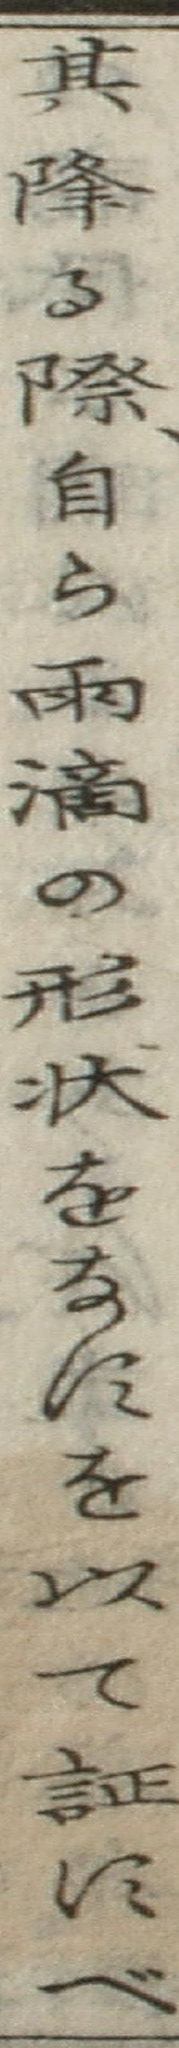其降る際、自ら雨滴の形状をなすを以て証すべ
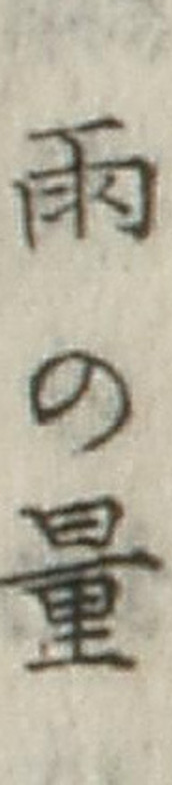雨の量
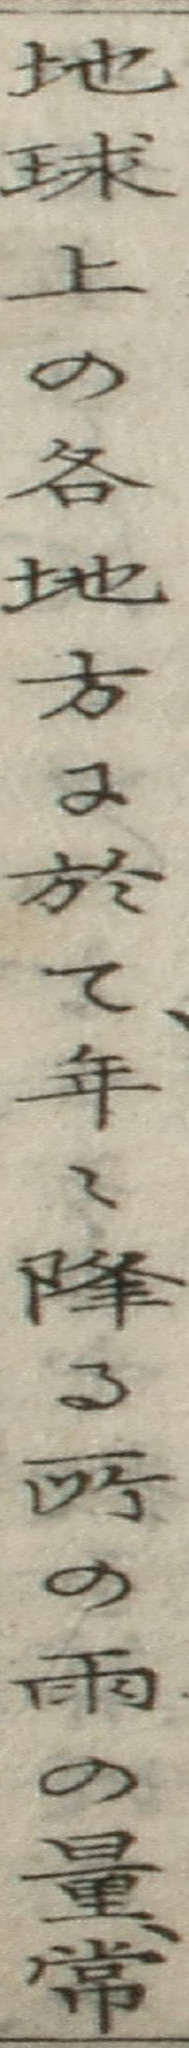地球上の各地方に於て、年〻降る所の雨の量、常

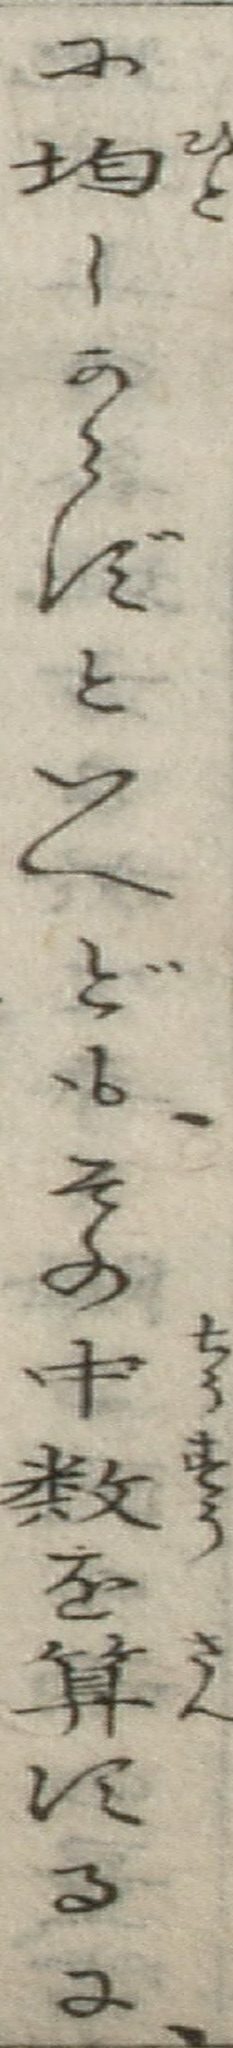に均しからずといへども、その中数を算するに、
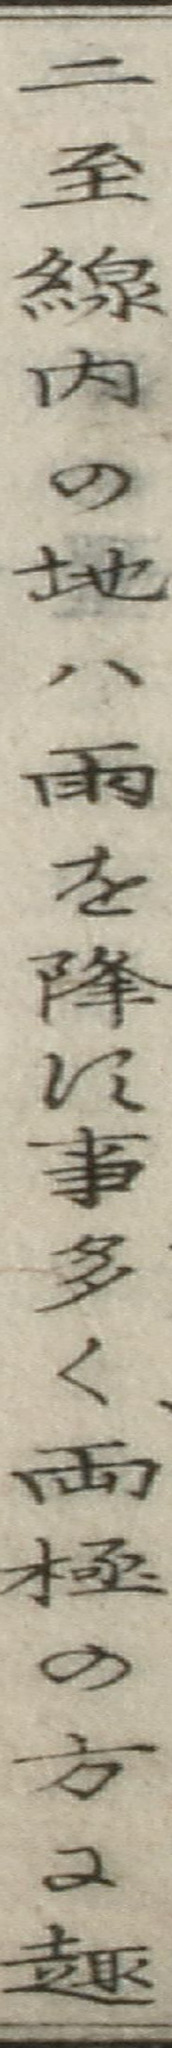二至線内の地は雨を降す事多く、両極の方に趣
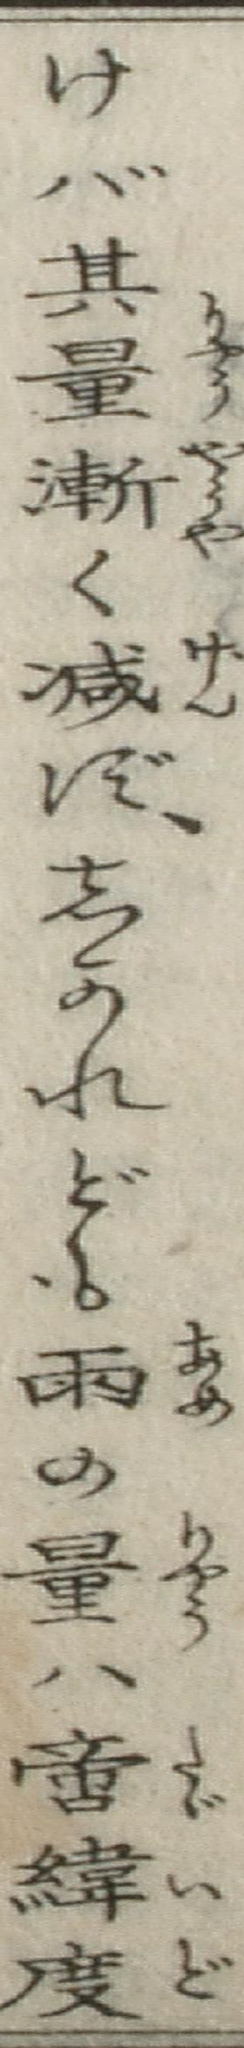けば其量漸く減ず、しかれども雨の量は啻緯度
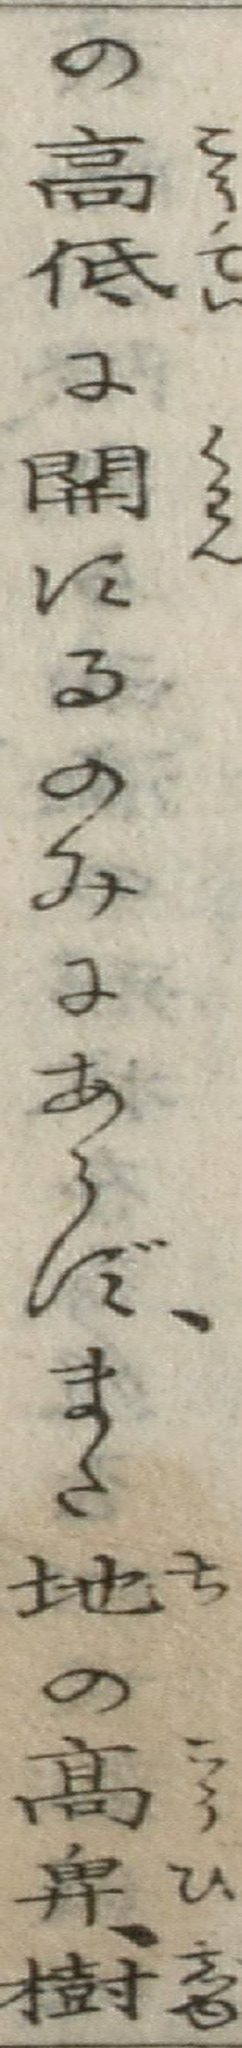の高低に関するのみにあらず、また地の高卑、樹
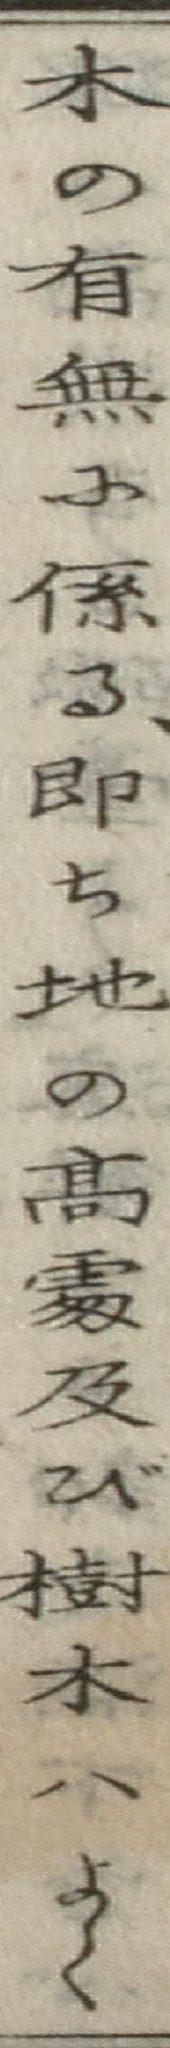木も有無に係る、即ち地の高処及び樹木はよく
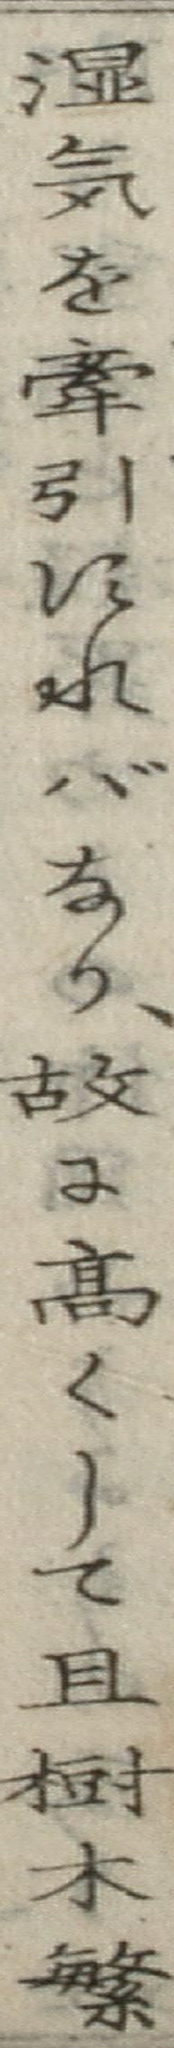湿気を牽引すればなり、故に高くして且樹木繁
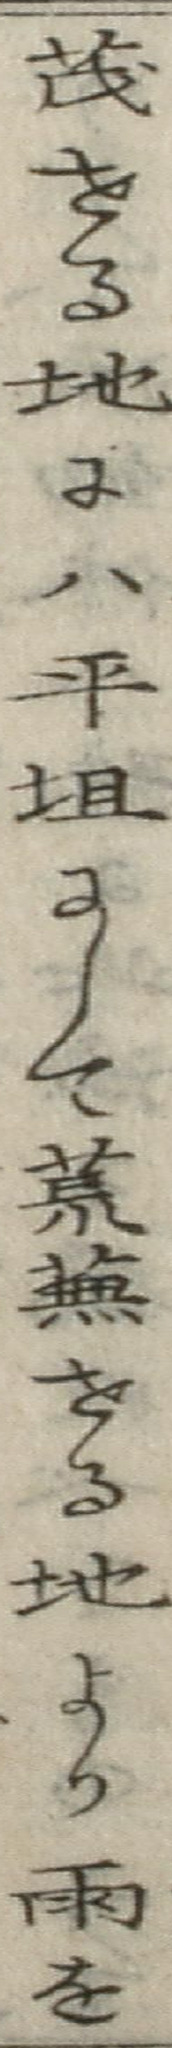茂せる地には、平坦にして荒蕪せる地より雨を
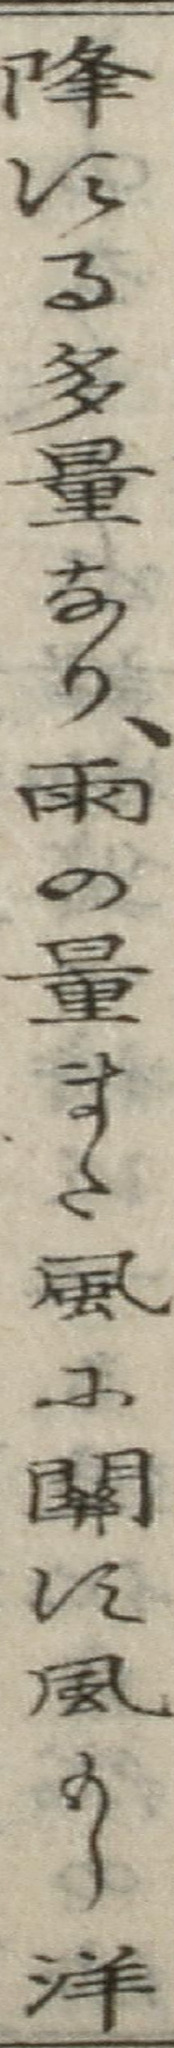降する多量なり、雨の量また風に関す、風もし洋
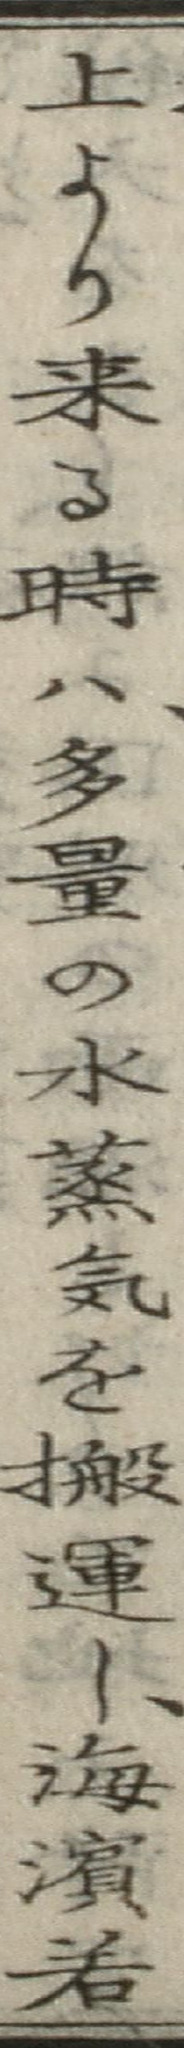上より来る時は、多量の水蒸気を搬運し、海浜若
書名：訓蒙　天然地理學　下
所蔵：東京大学地震研究所図書室 Earthquake Research Institute Library, The University of Tokyo, JAPAN
